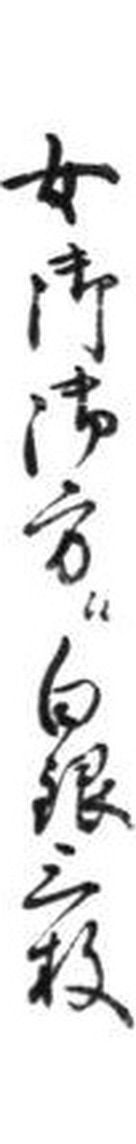女御御方江白銀三枚
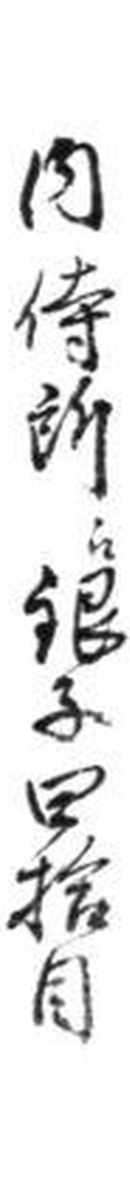内侍所江銀子四拾目
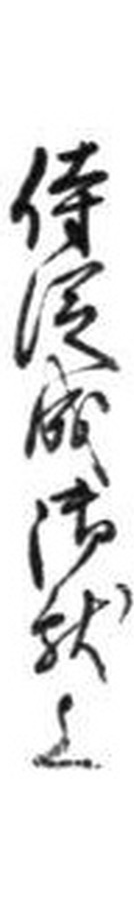侍従成御献上
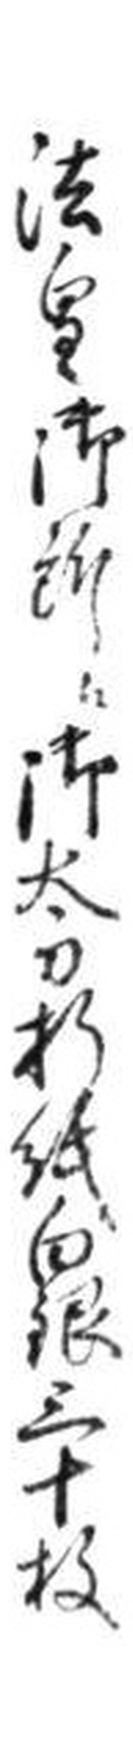法皇御所江御太刀折紙白銀三十枚
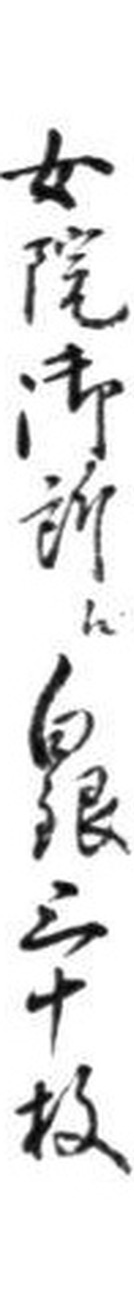女院御所江白銀三十枚
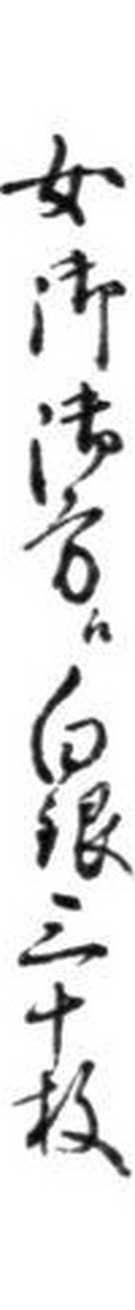女御御方江白銀三十枚
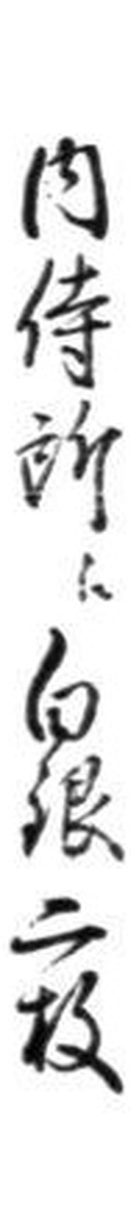内侍所江白銀二枚
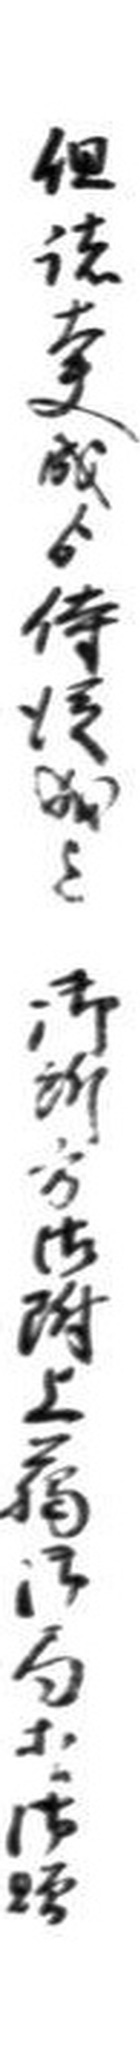但諸大夫成ゟ侍従成迄御所方御附上臈御局等江御贈
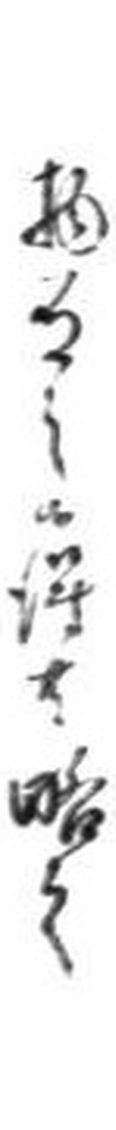物有之候得共略之
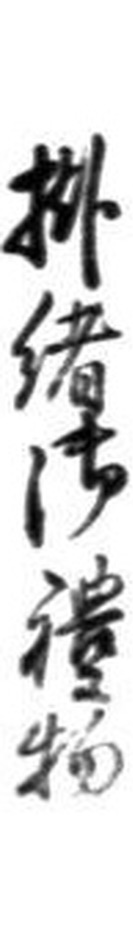掛緒御礼物
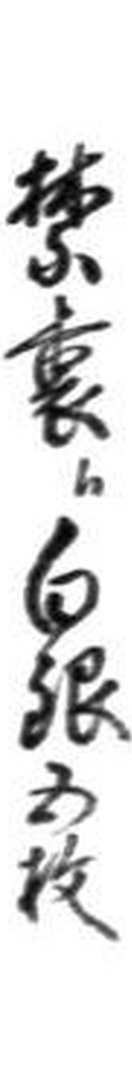禁裏江白銀五枚
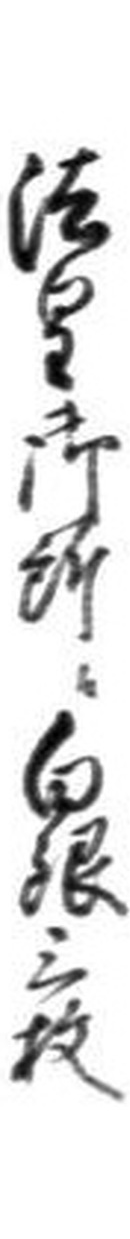法皇御所江白銀三枚
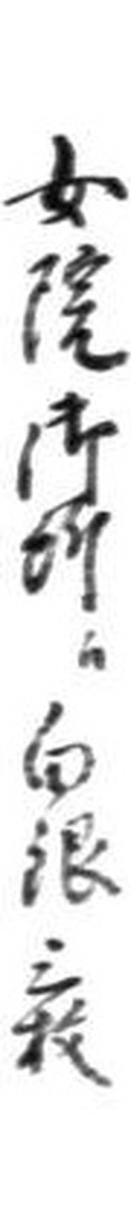女院御所江白銀三枚
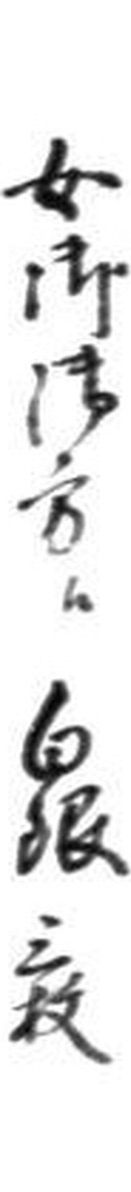女御御方江白銀三枚
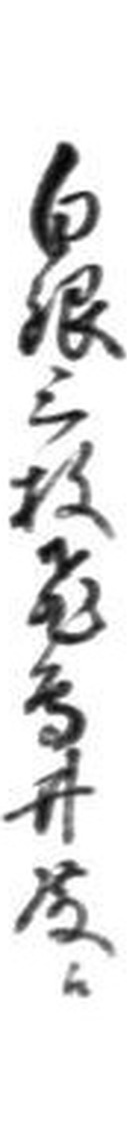白銀三枚飛鳥井殿江

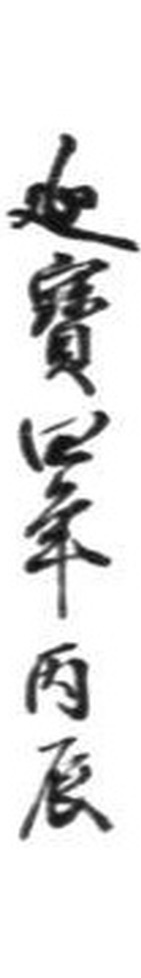延宝四年丙辰
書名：家譜 十三 綱昌公 従寛文元年到延宝五年
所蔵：福井県文書館 Fukui Prefectural Archives
